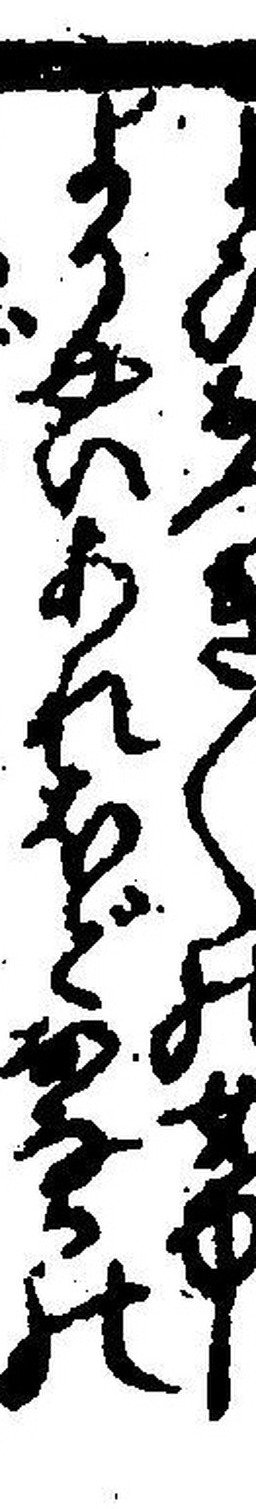よりやいれほどおなかの
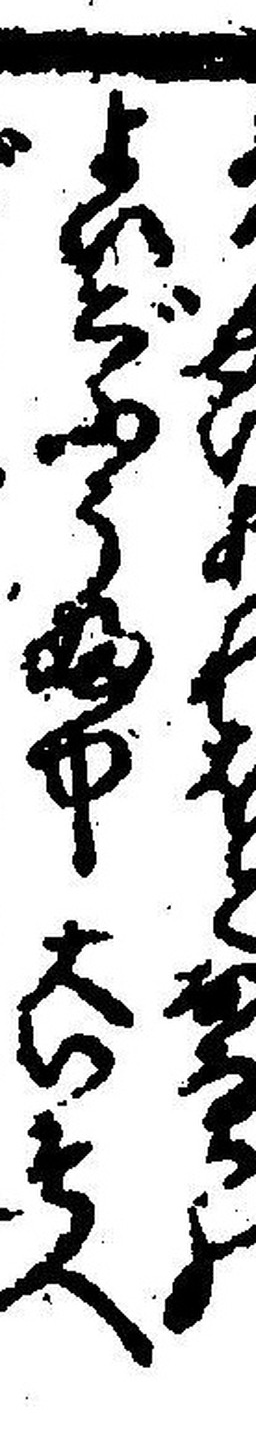よいごふうふ中大いそへ
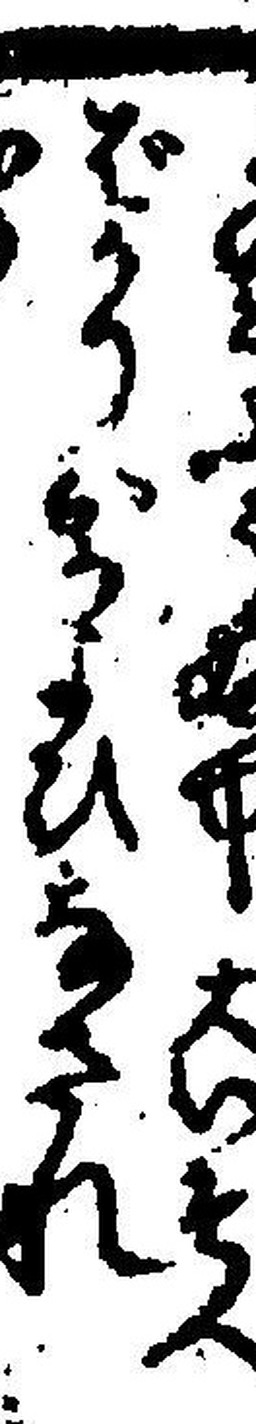ばかりおかよひなされ
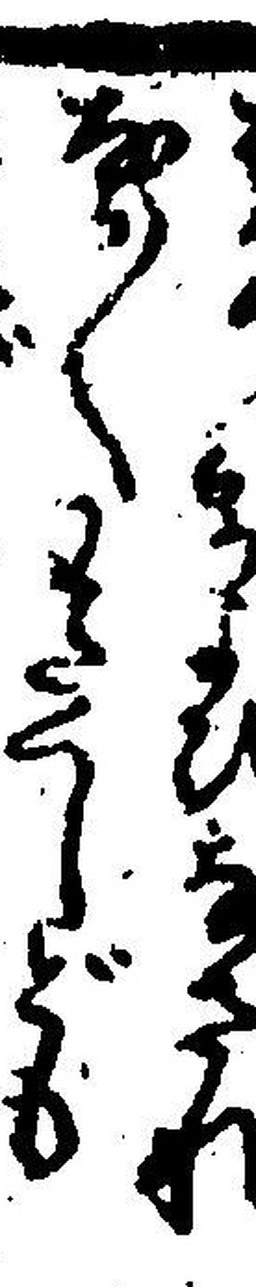なか〳〵わたくしども
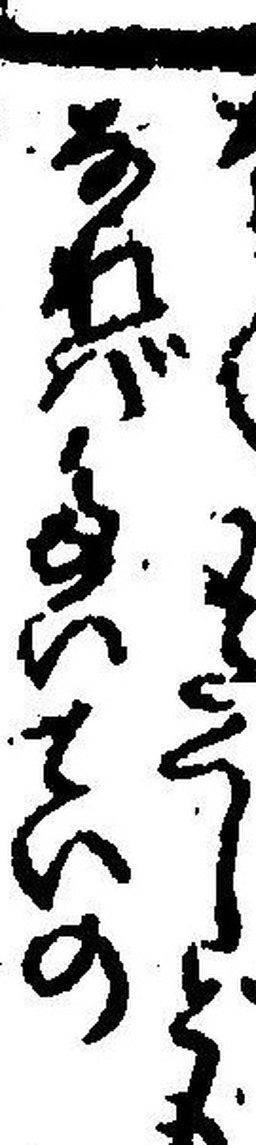なればたいていの
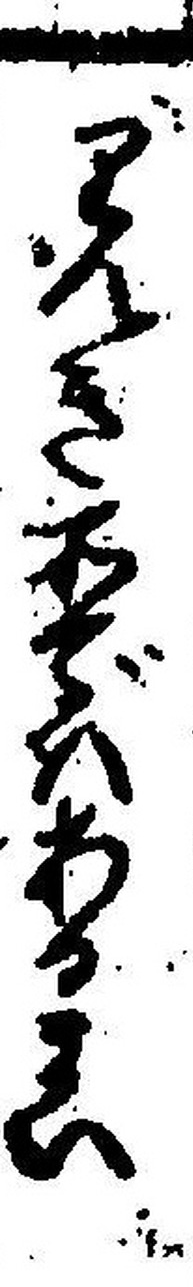りんき所ではあるまい
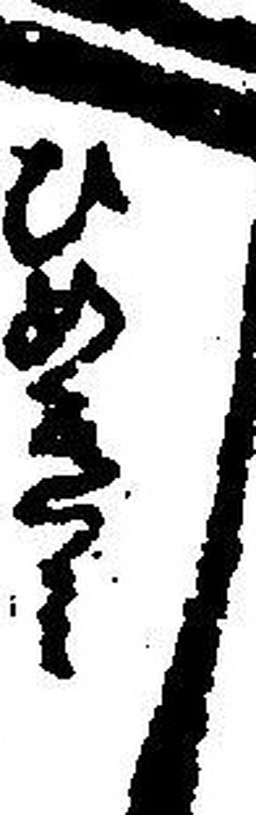ひめきみ
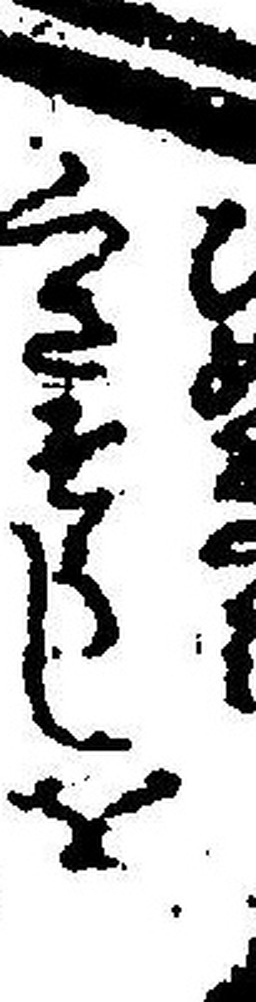くさそうしを
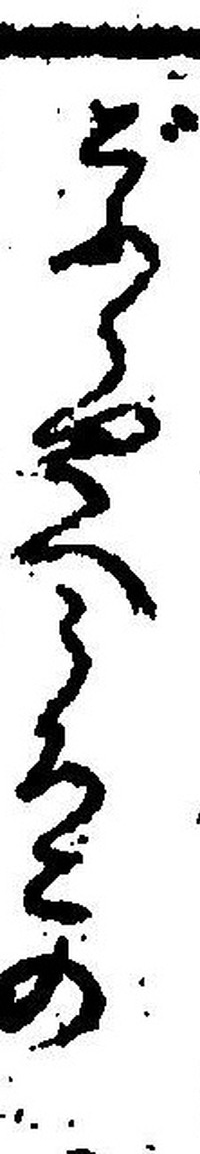ごふくやへうろこの
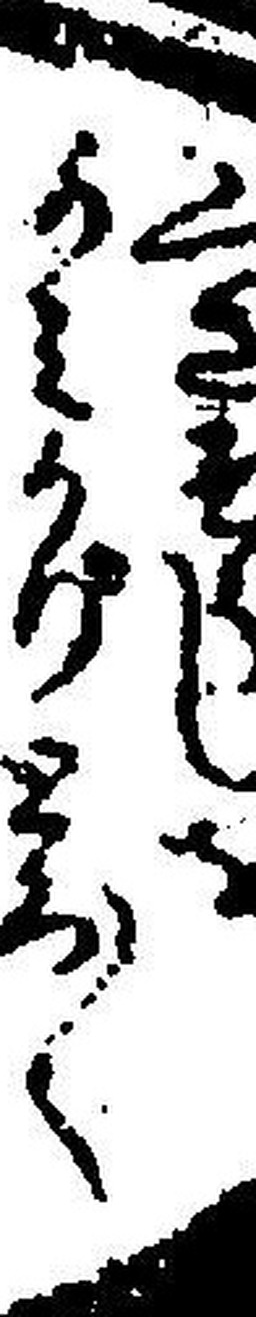よいかけとろ〳〵
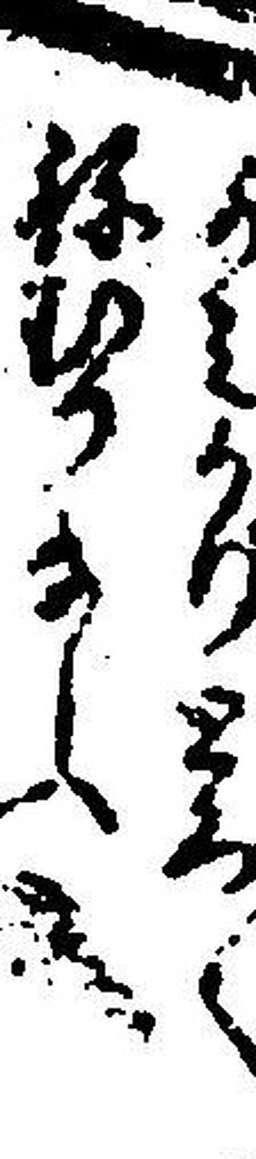ねむり給ふ
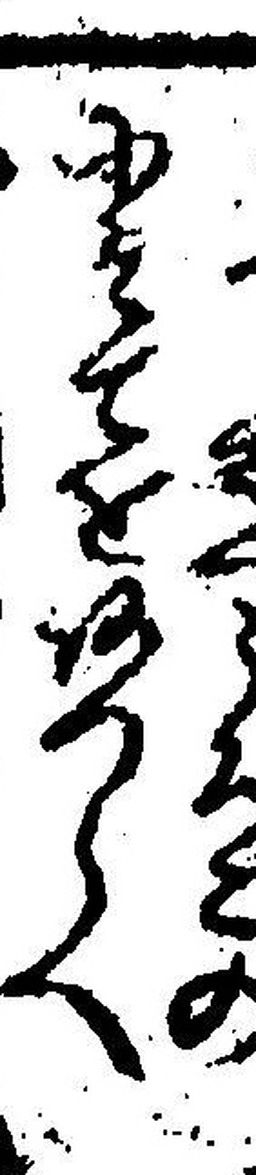小そてをあつらへ
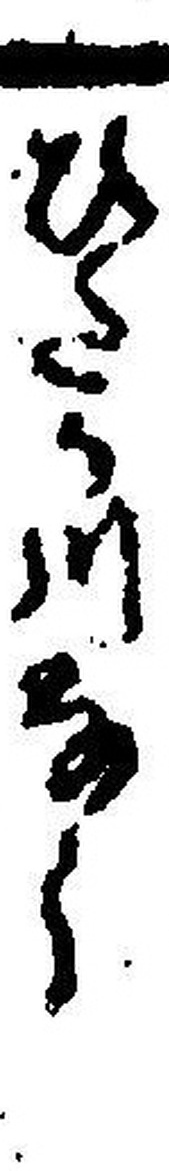ひたか川なら
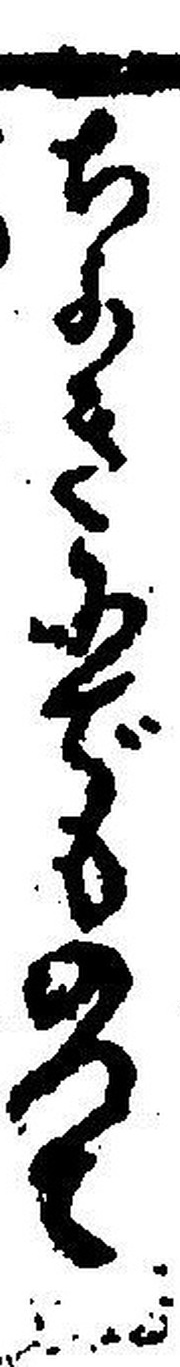ちよきにでものつて
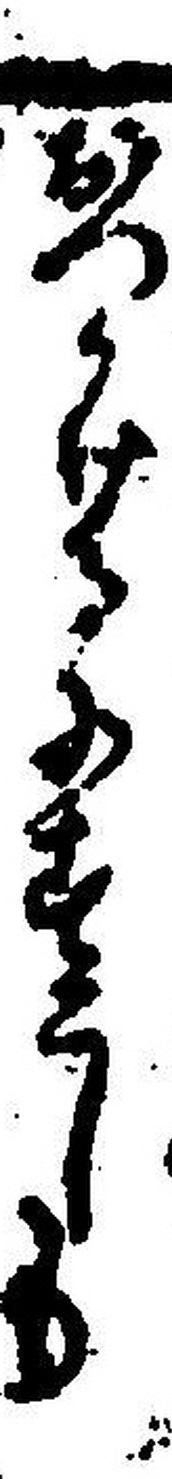おつかけるにすこしも
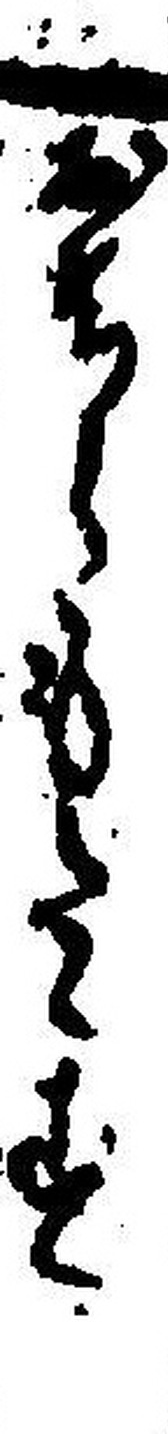おはらもたゝす
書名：御代参牛時詣 / 市場通笑作
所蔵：東京大学総合図書館 General Library in the University of Tokyo, JAPAN
